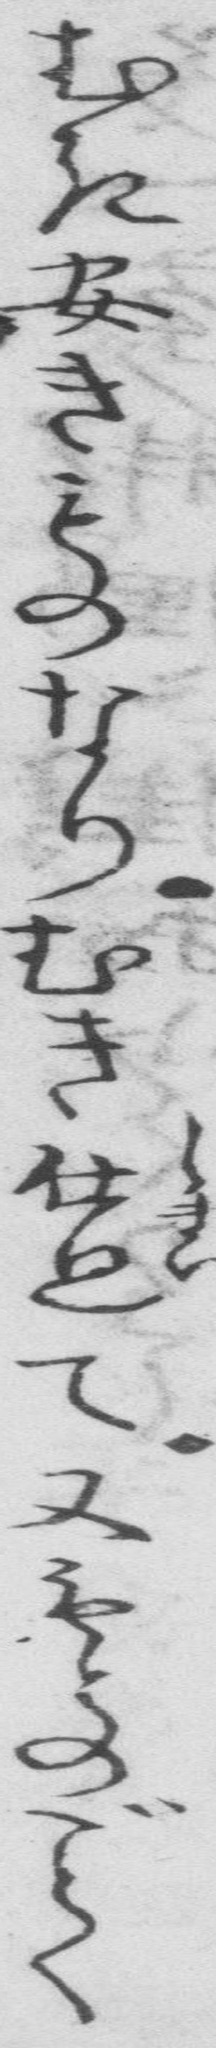むき安きものなり。むき仕廻て。又もとのごとく
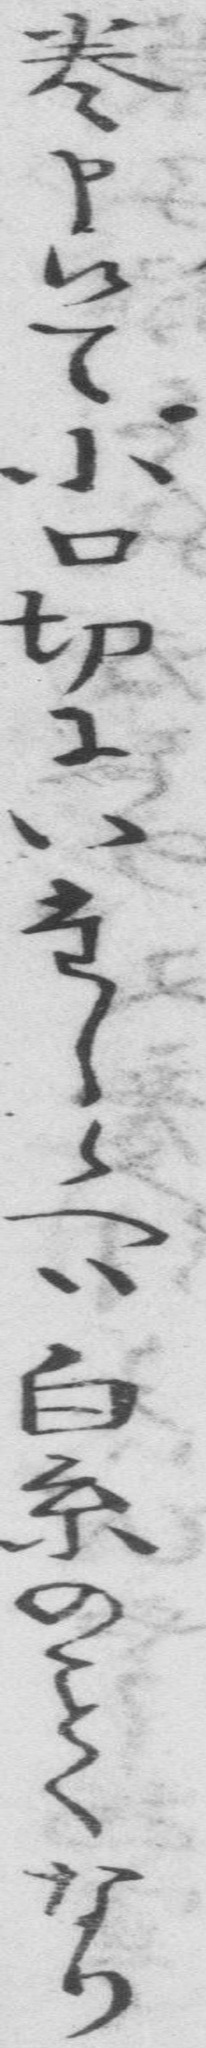巻申候て。小口切にいたし候へは白糸のことくなり
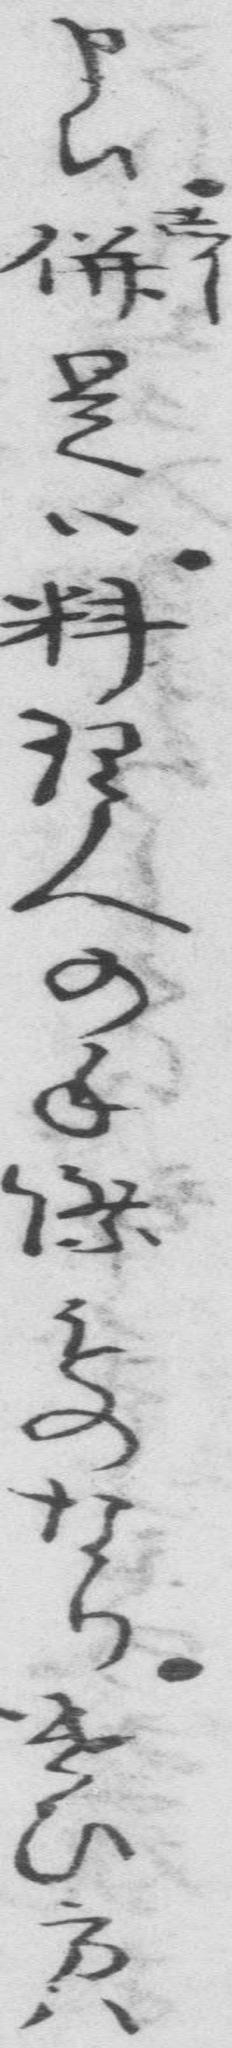申候。併是は。料理人の手際ものなり。遣ひ方は
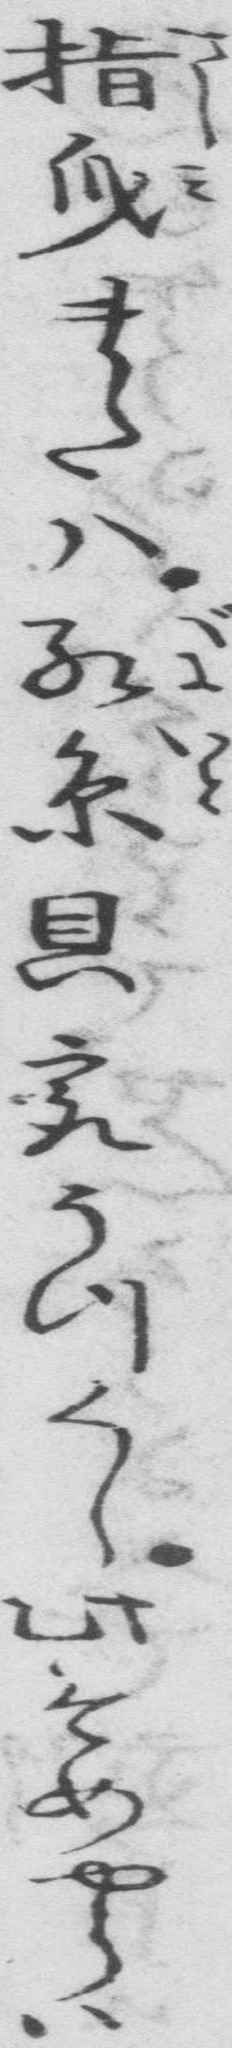指身または。紅糸貝最うつくし。此もめやうは
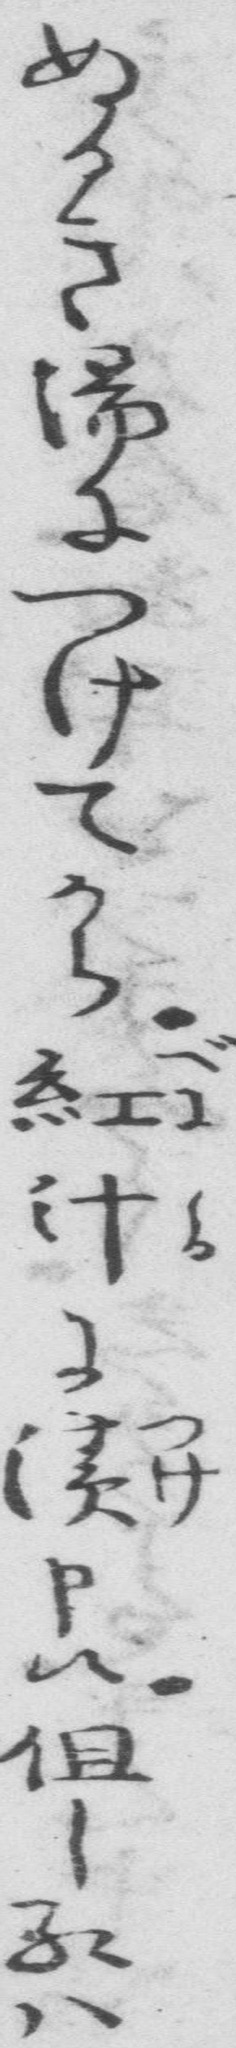ぬるき湯につけてから。紅汁に漬申候。但しるは
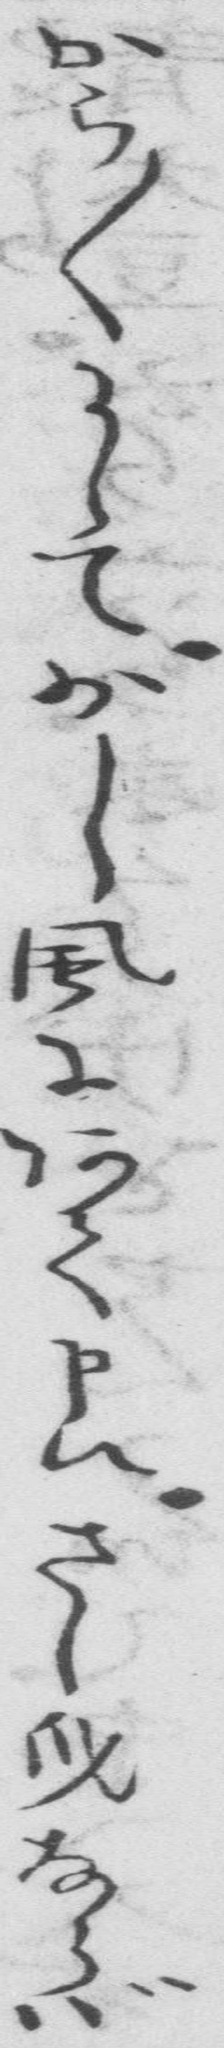から〳〵にして。少し風にあて申候。さし身ならば
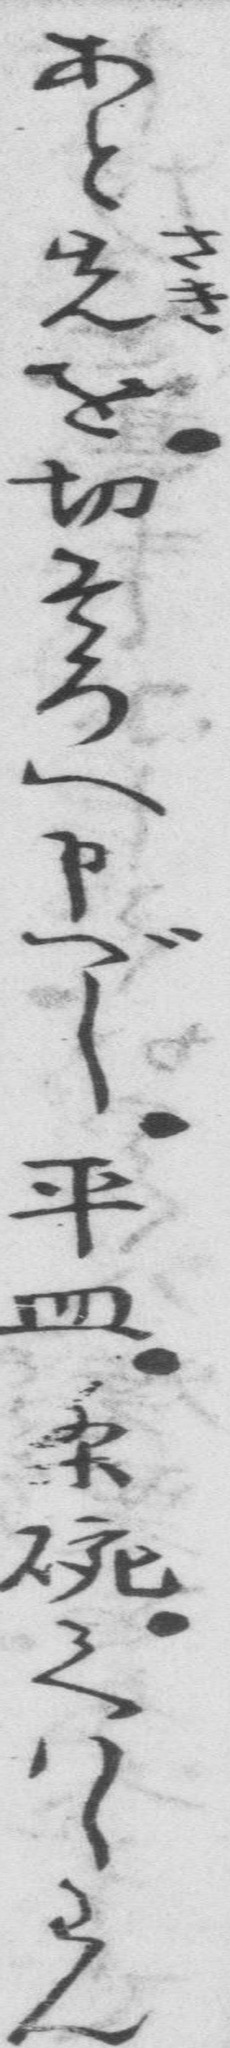あと先を。切そろへ申べし。平皿。茶碗。くはしわん
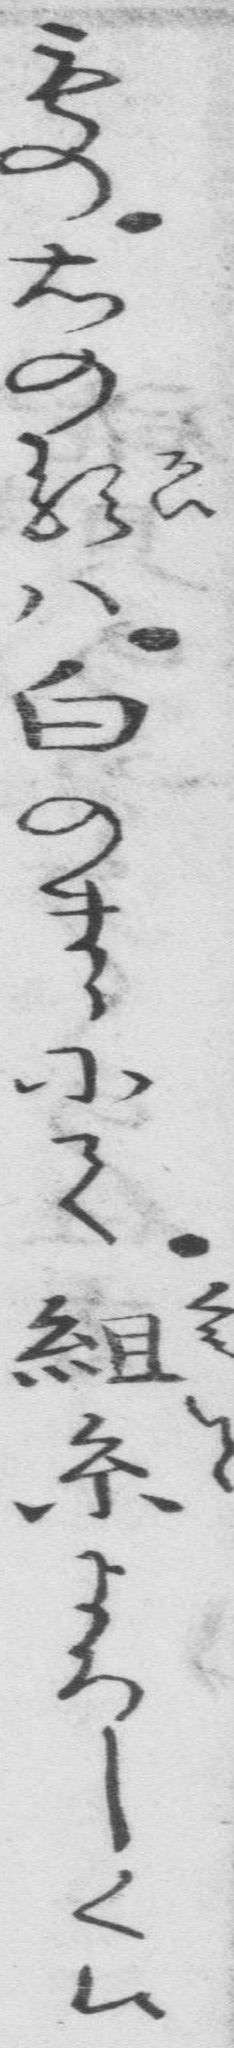もの。右の類は。白のまゝにて。組糸よろしく候
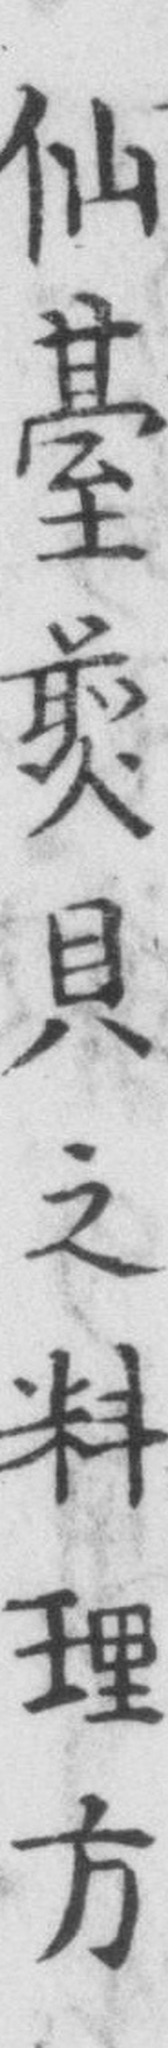仙台煎貝之料理方
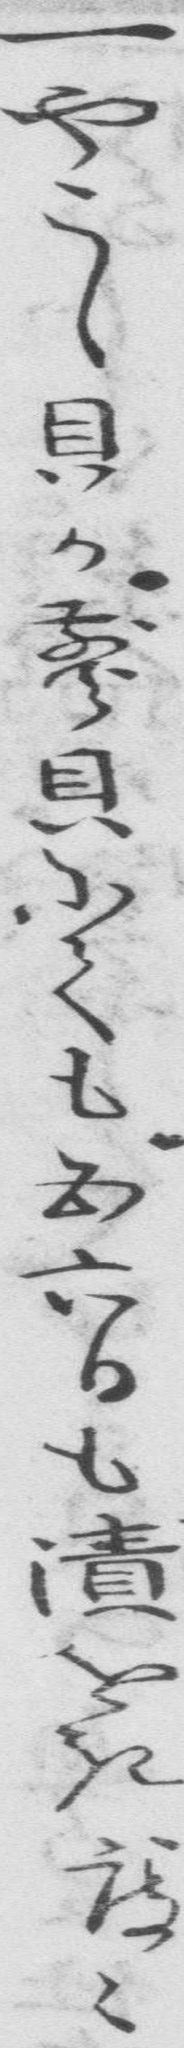一やこし貝か。煎貝にても。五六日も漬をき。度々
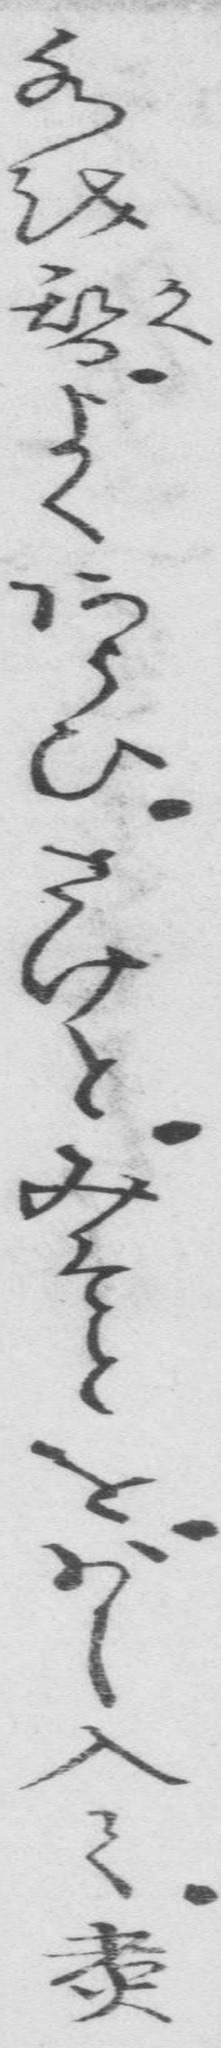水を替。よくあらひ。さけと。みそとを。少し入て。煮
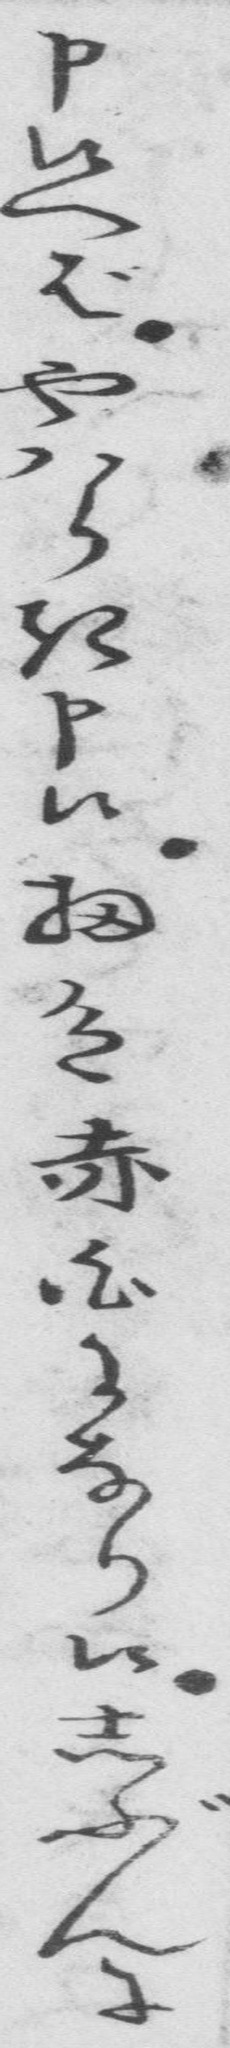申候へば。やはらき申候。扨色赤白になり候。しぶんに
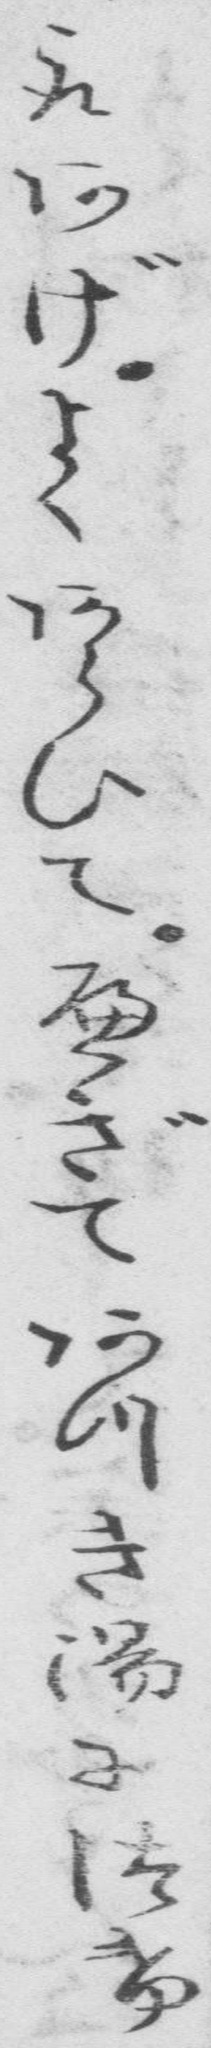取あげ。よくあらひて。へぎてあつき湯につけ
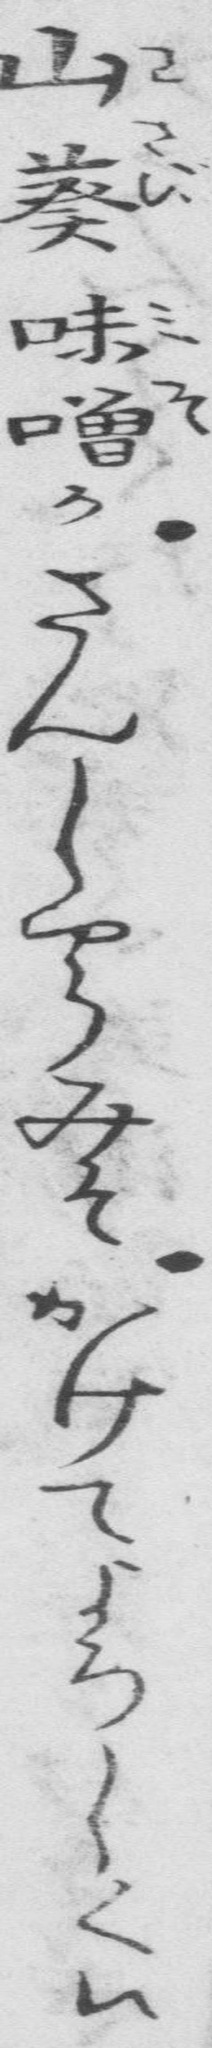山葵味噌か。さんしやうみそ。かけてよろしく候
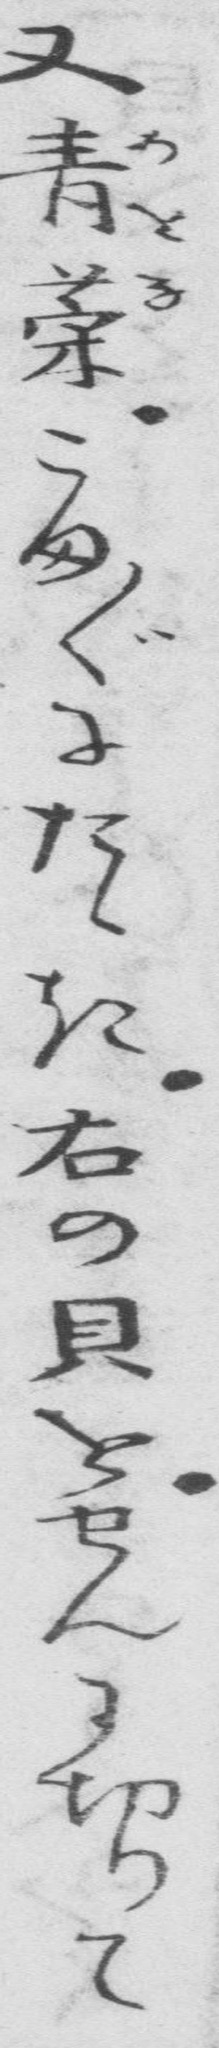又青菜。こま〴〵にたゝき。右の貝を。せんに切りて
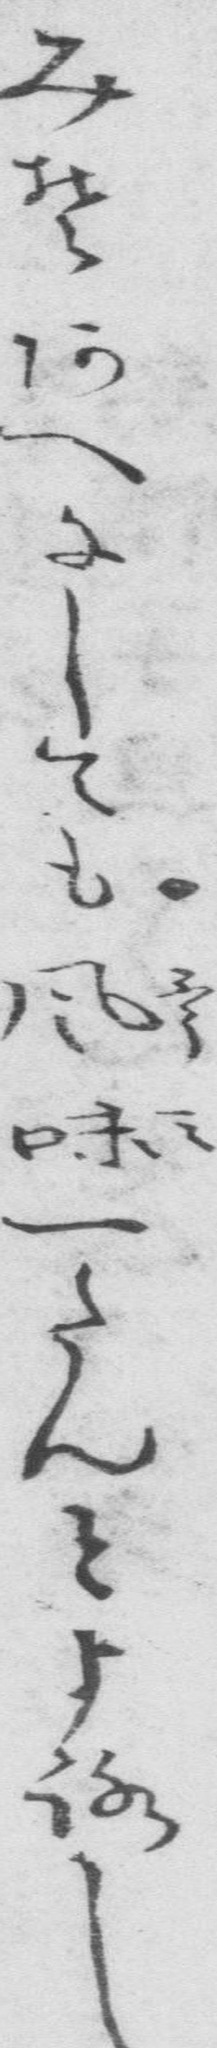みそあへにしても。風味一たんとよろし
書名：萬寳料理秘密箱
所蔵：大阪府立大学学術情報センター 国文学研究資料館
